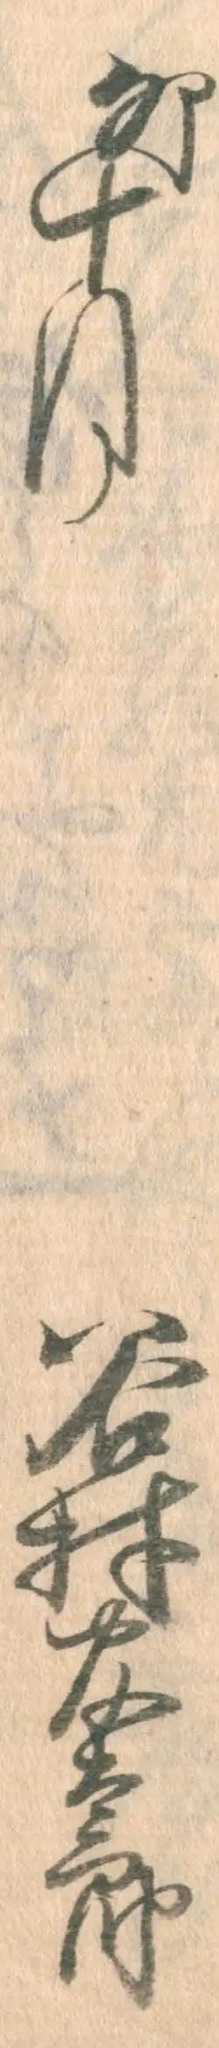卯十月谷村官太郎
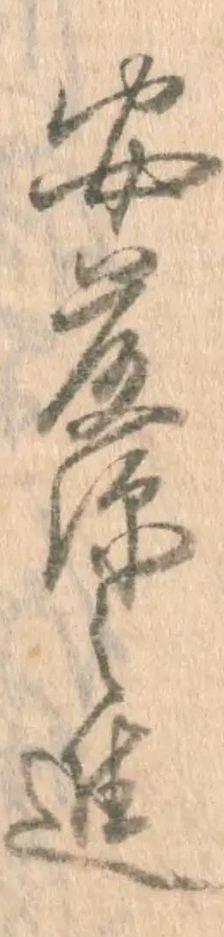安藤源之進
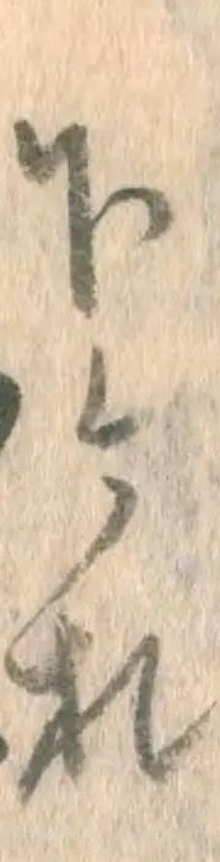下ケ札
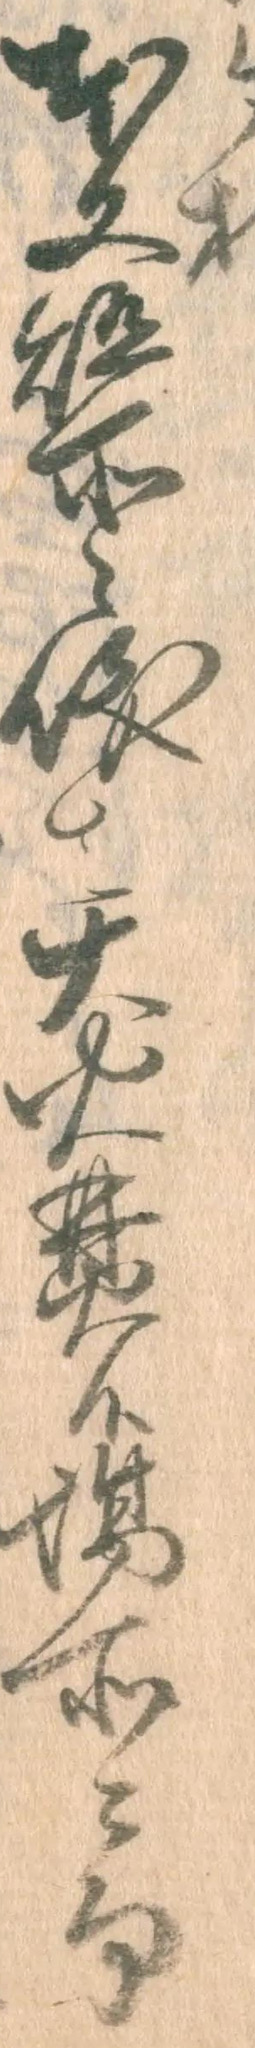本文賄所之儀大火焚候場所ニて
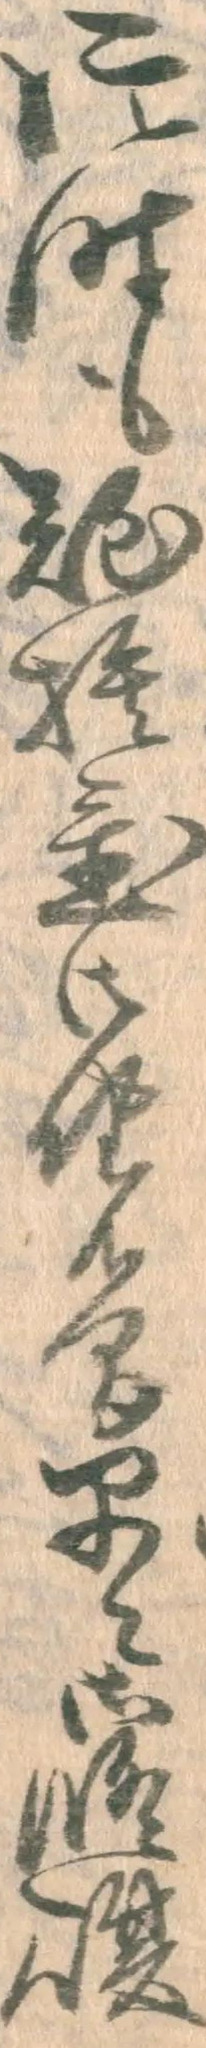片時も難捨置候由之間早〻御修復
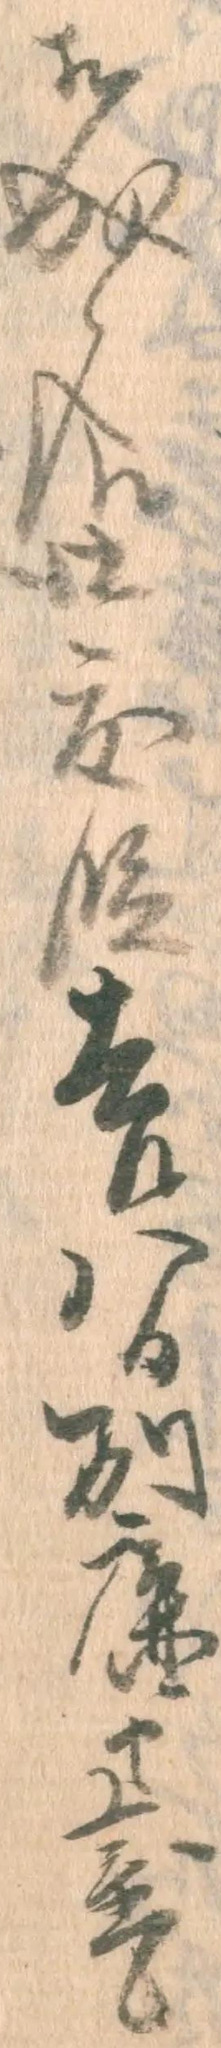相成候様仕度段去ル八日別廉ニ申上奉候
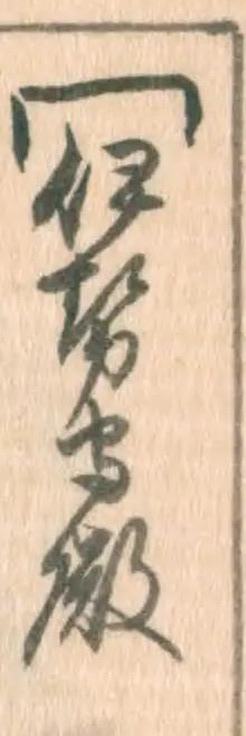│[伊勢守殿
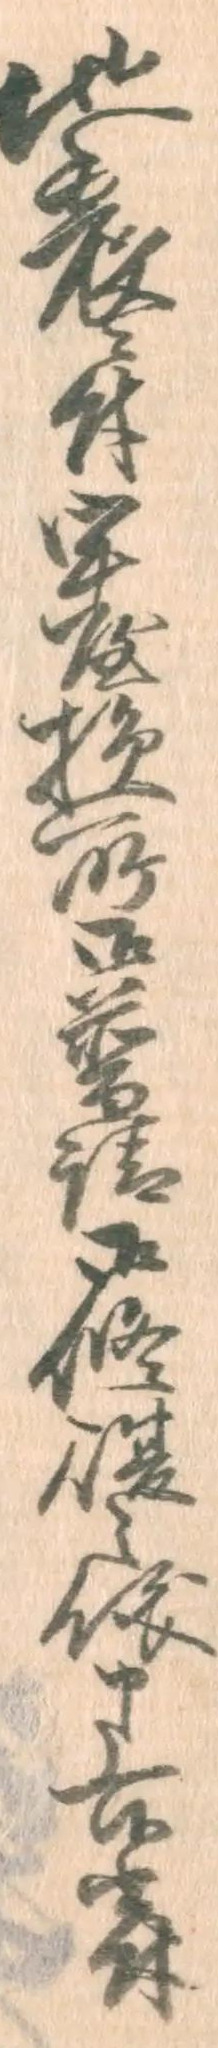│地震ニ付牢屋敷損所御普請御修復之儀申上候書付
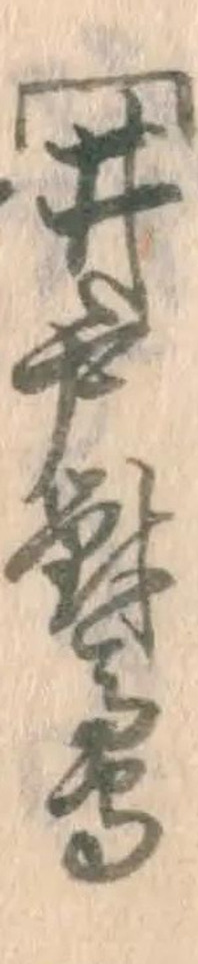│[井戸対馬守
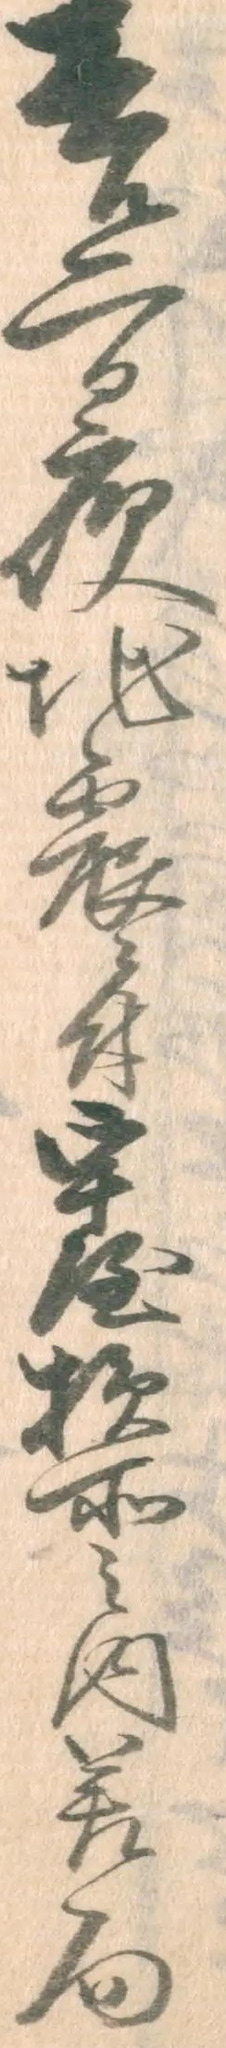去ル二日夜地震ニ付牢屋損所之内差向
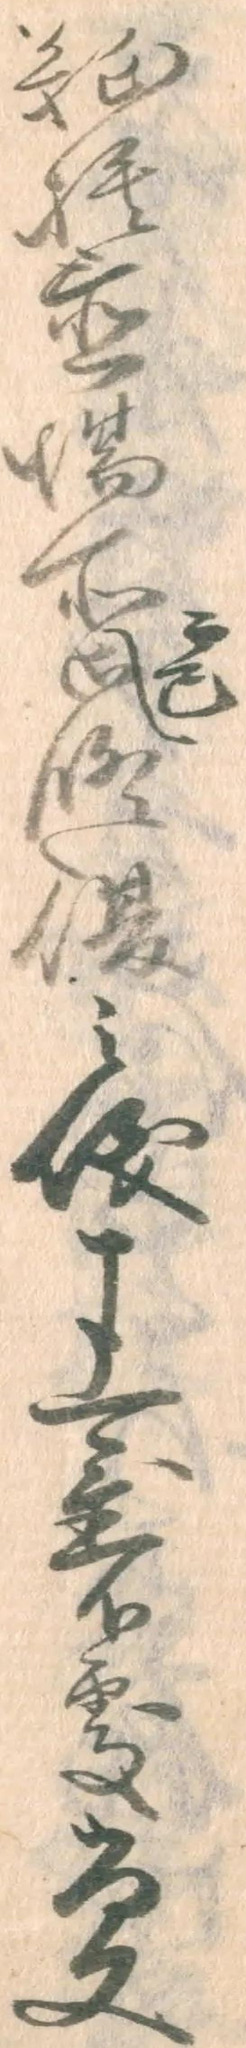難捨置場所而已御修復之儀申上置候処尚又
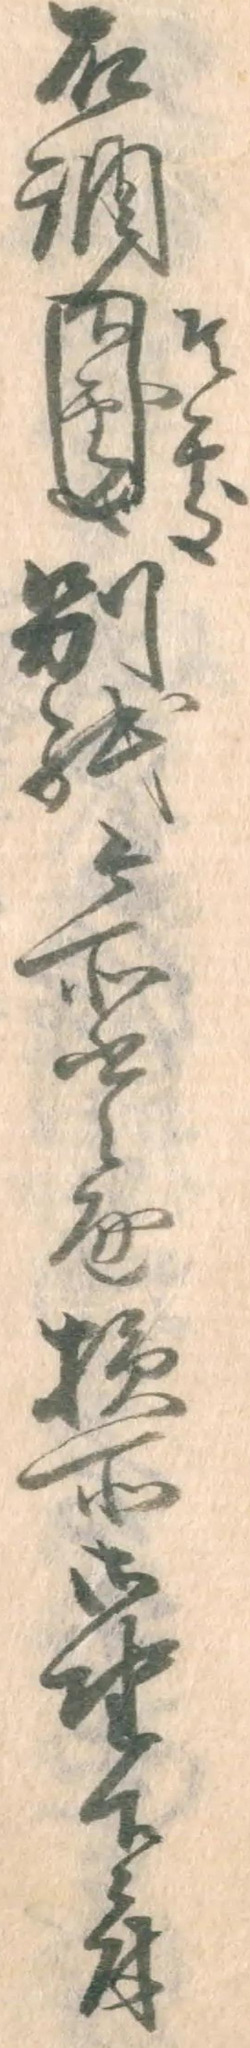取調候処ケ処別紙ケ所書之通損所御座候ニ付

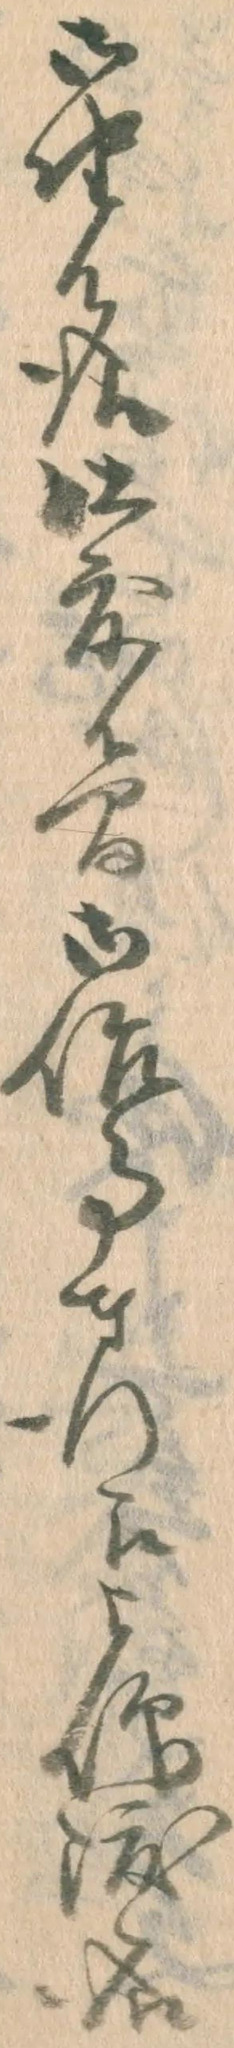御座候様仕度候間御作事奉行え被仰渡候様
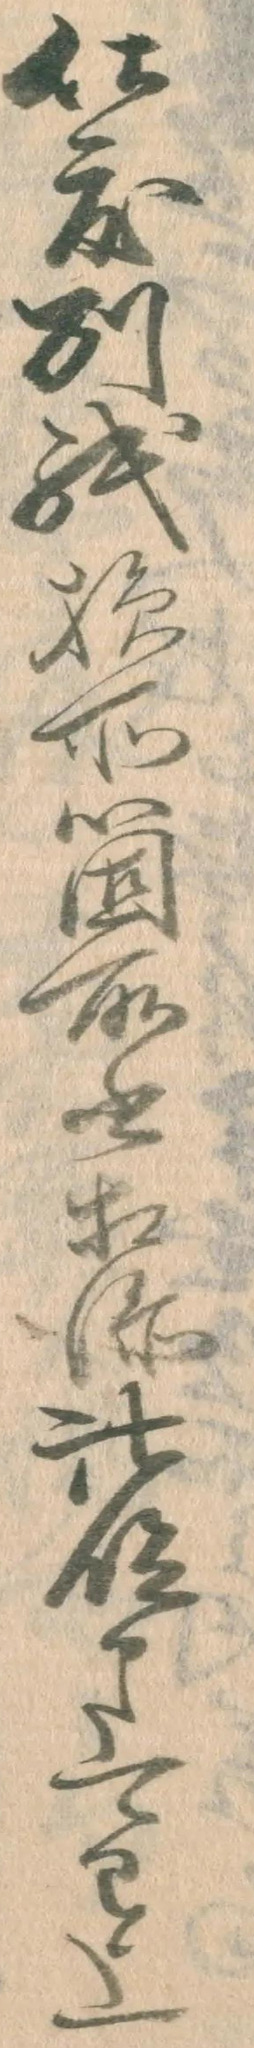仕度別紙損所箇所書相添此段申上候已上
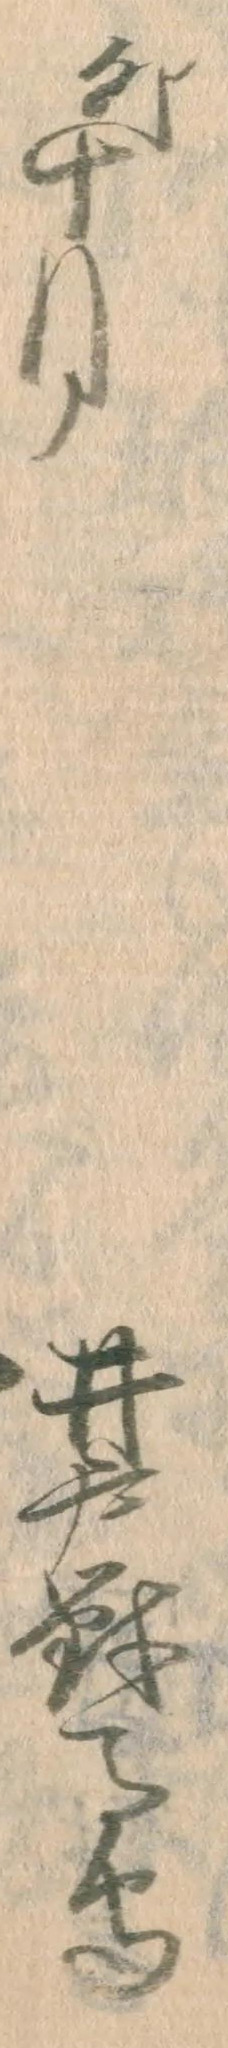卯十月井戸対馬守
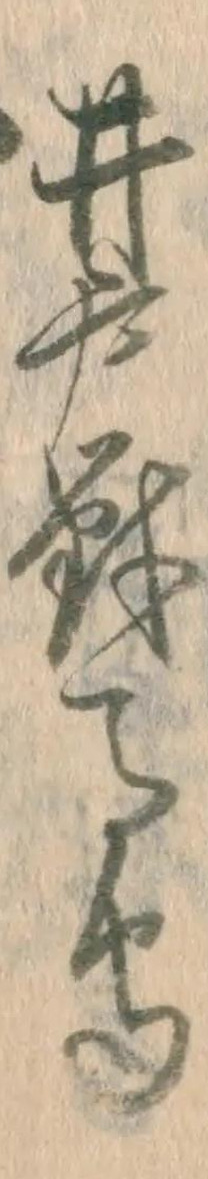卯十月井戸対馬守
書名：七十冊物類集 71巻. [44] 四十三 牢屋敷御普請御修覆地震ニ付骨折候牢屋掛御褒美之部
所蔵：国立国会図書館 National Diet Library, JAPAN
